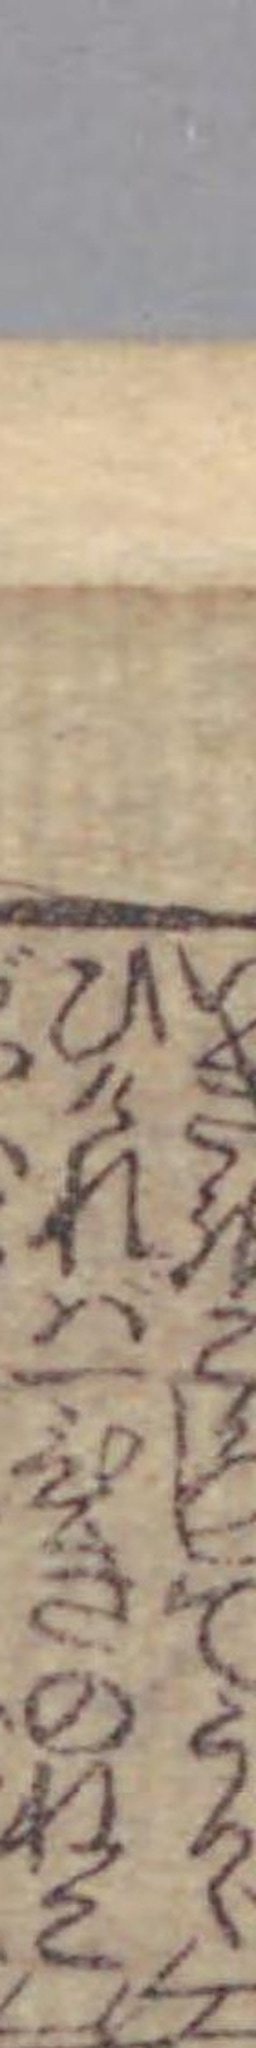ひければ一ひきのねこ
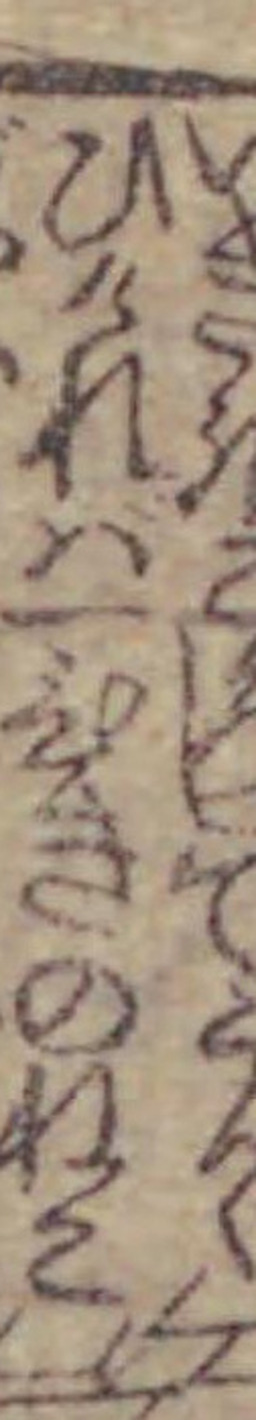ひければ一ひきのねこ
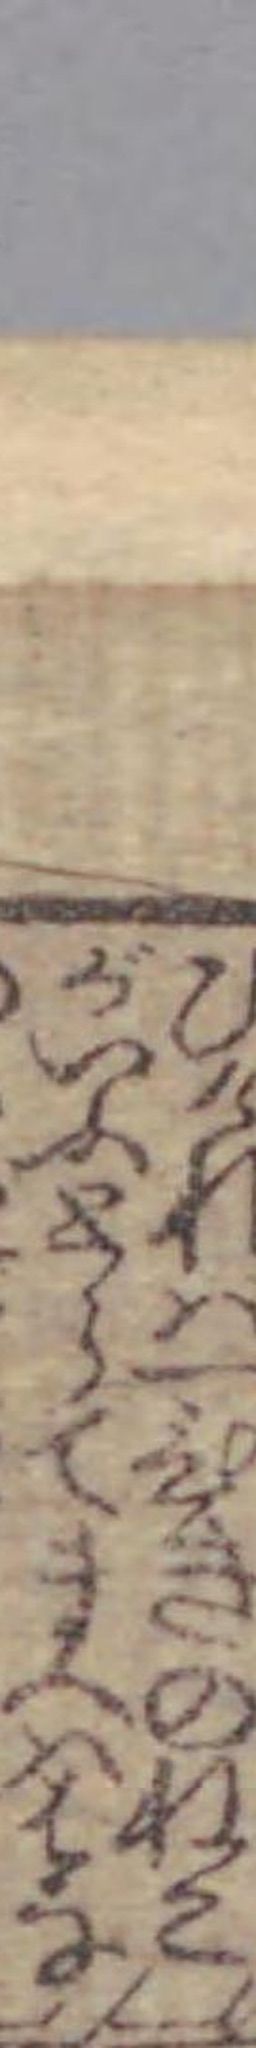がいふとらてまへははな
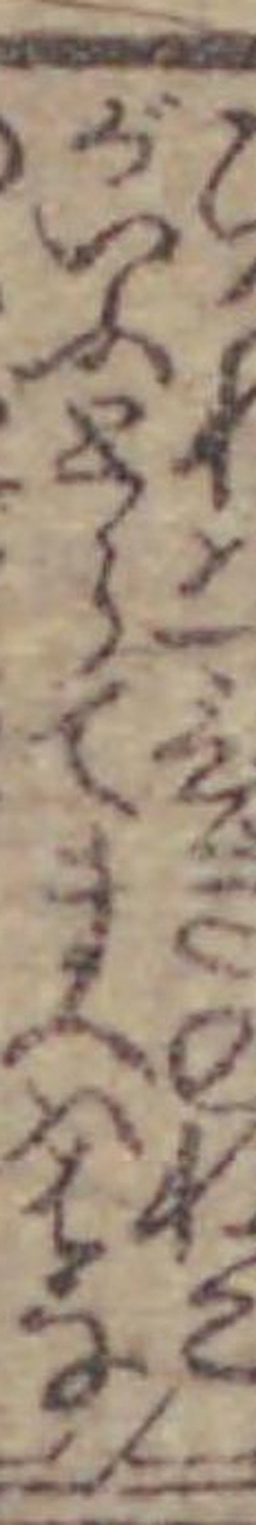がいふとらてまへははな
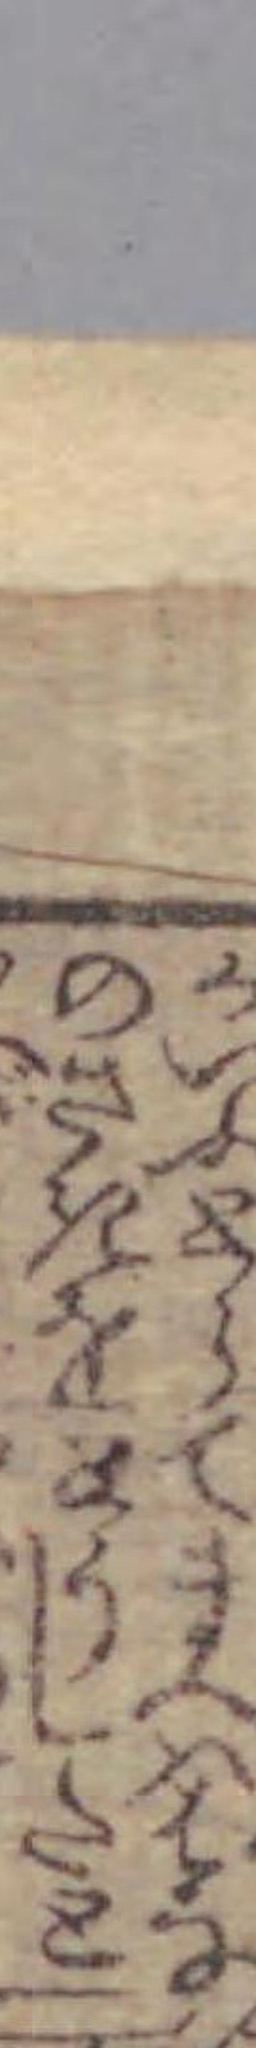のさきをとうしたと
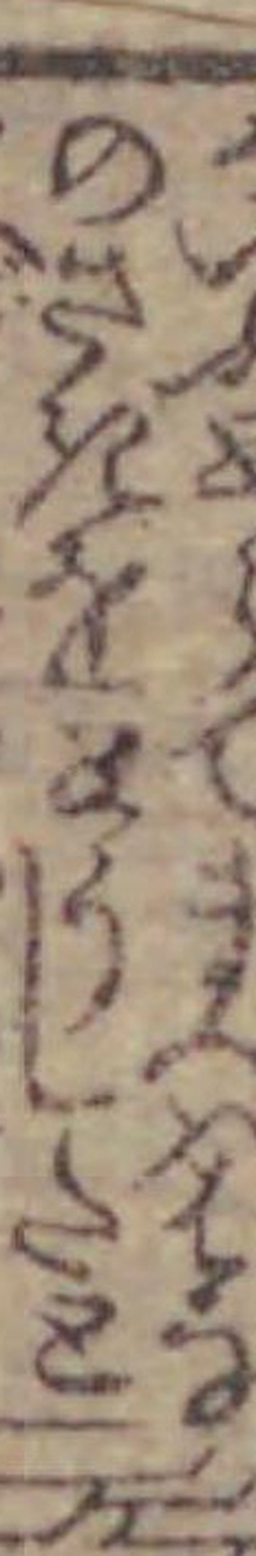のさきをとうしたと
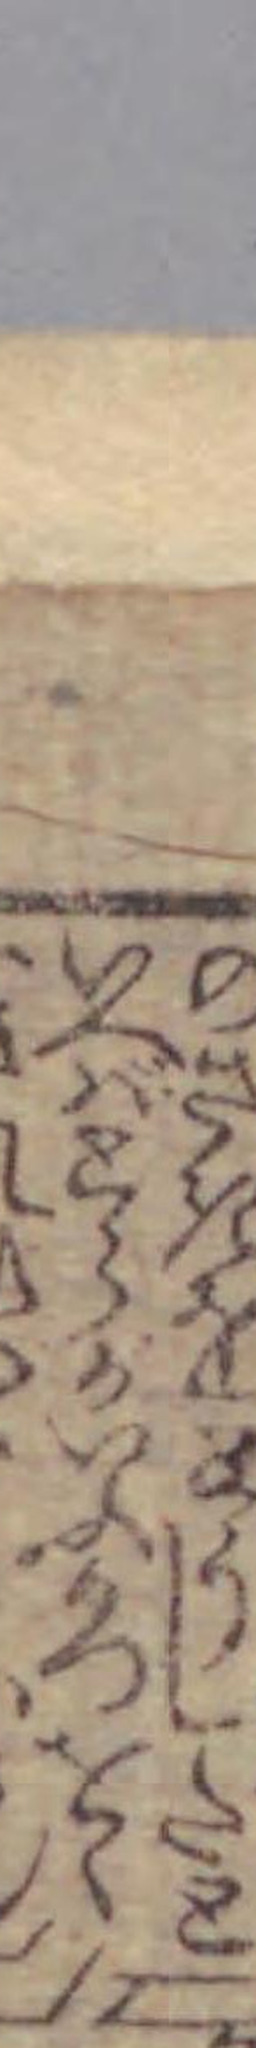いへばとらがいふかつをゝ
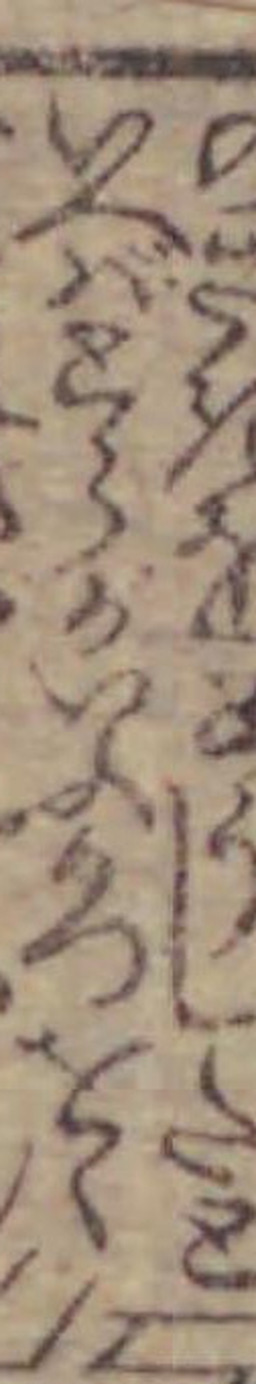いへばとらがいふかつをゝ
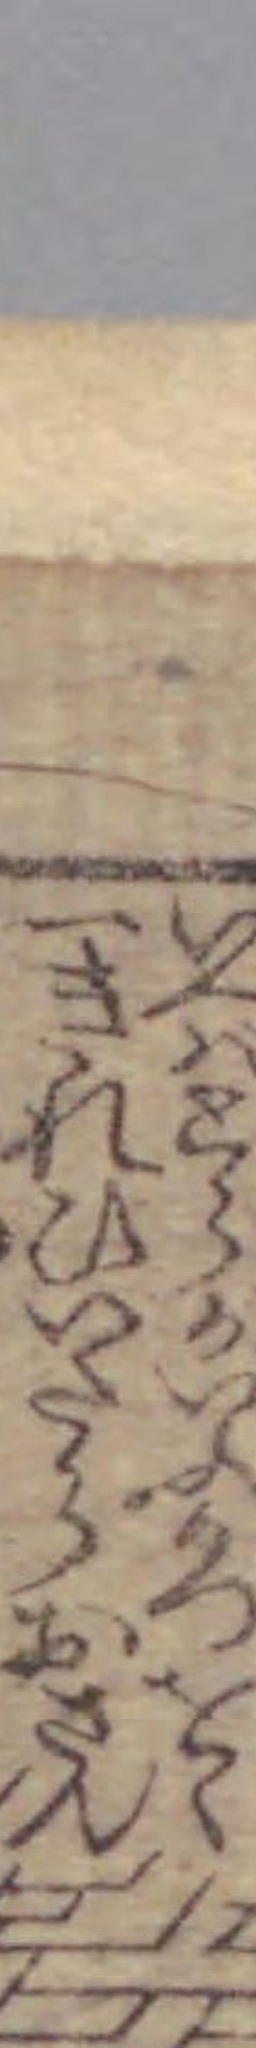一きれひいたらおさん
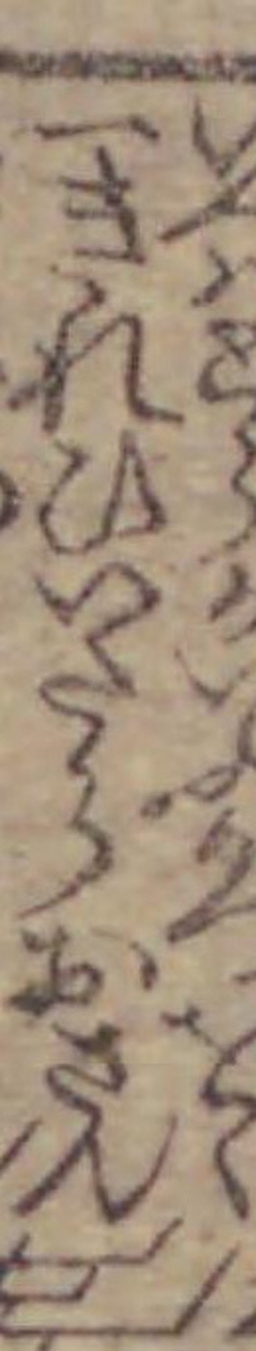一きれひいたらおさん
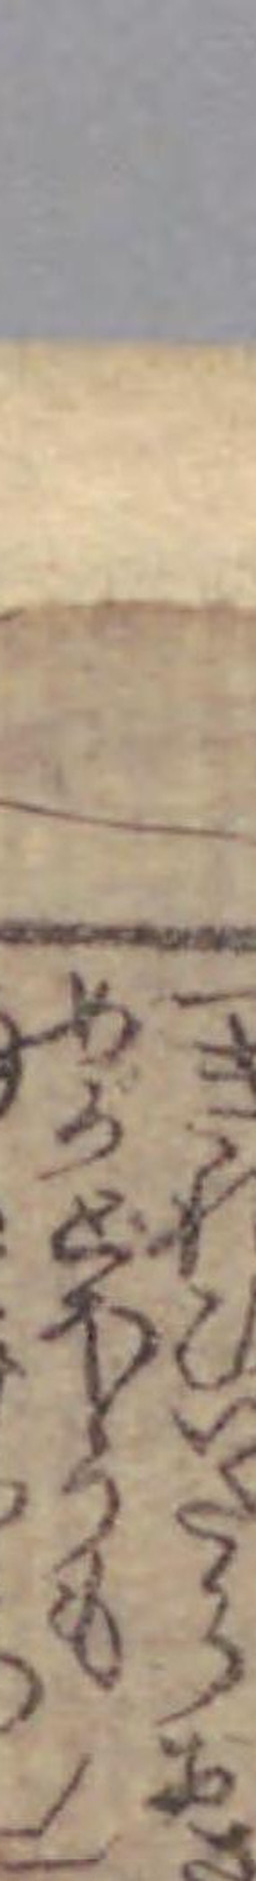めがとほうも
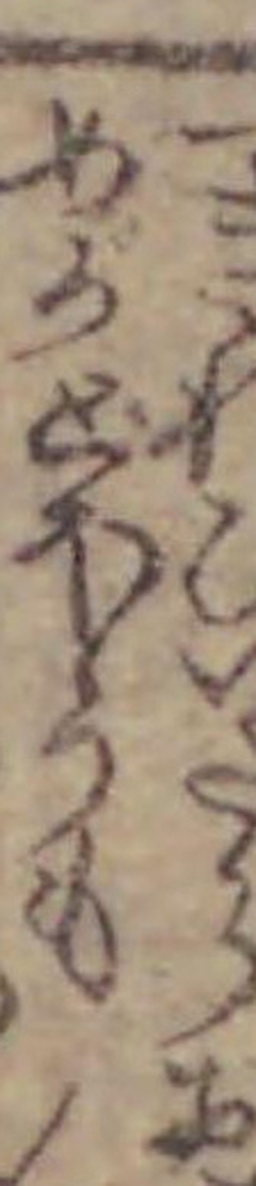めがとほうも
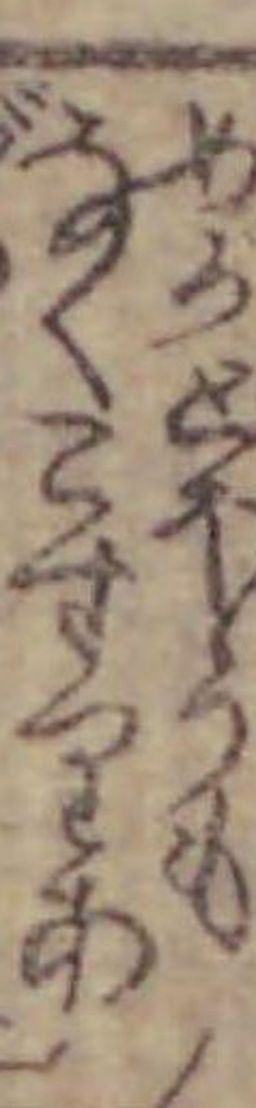なくこすりあ
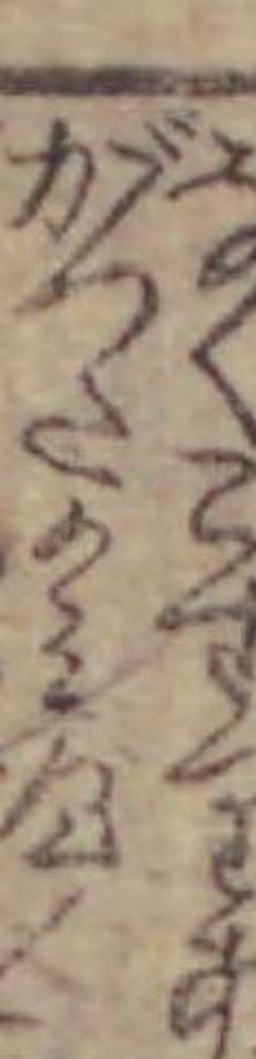がつたかみさま
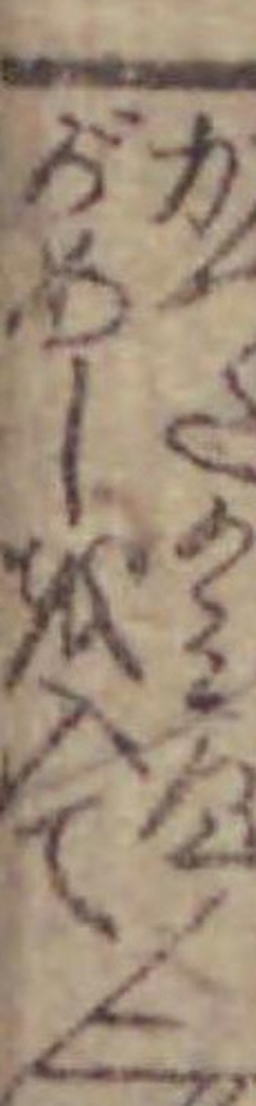がめしを入て
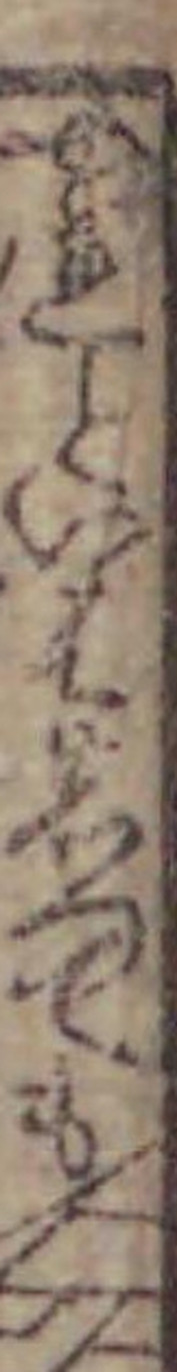やれといはしつても
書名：即席耳学問 : 3巻
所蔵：国立国会図書館 National Diet Library, JAPAN
